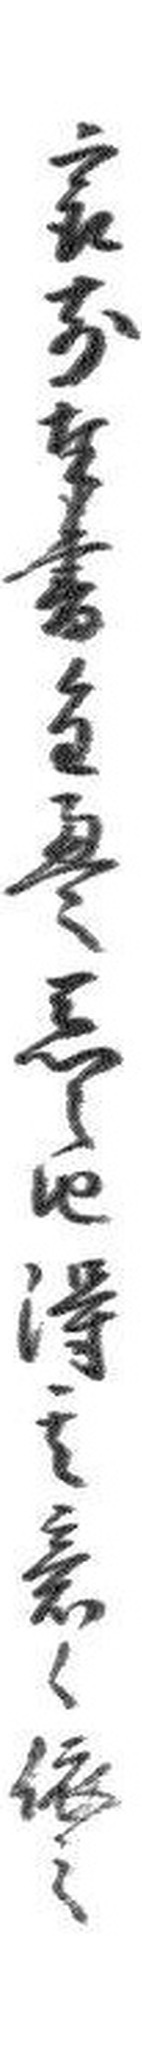最前奉書重畳忝之由得其意候依之

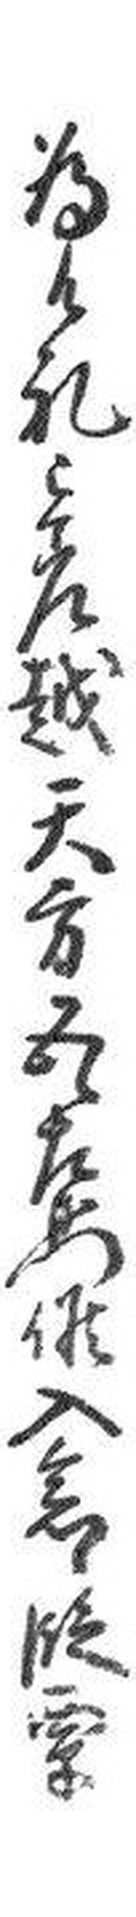為御礼被差越天方五郎左衛門候入念候段覃
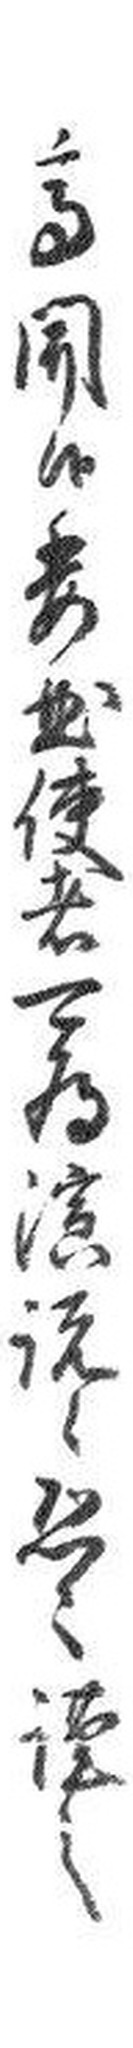高聞候委曲使者可為演説候恐々謹言
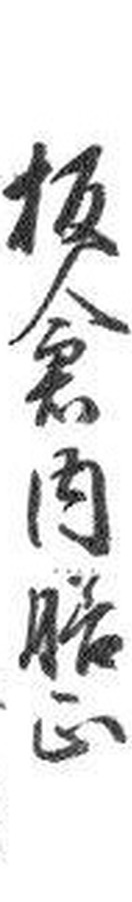板倉内膳正
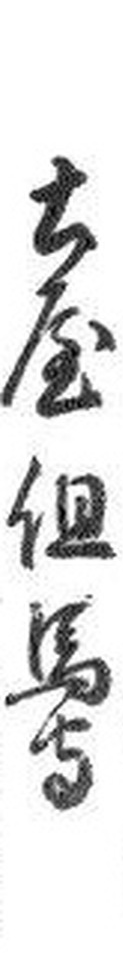土屋但馬守
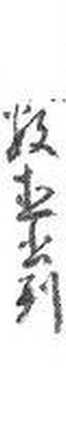数直書判
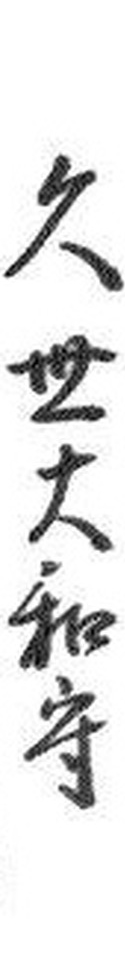久世大和守
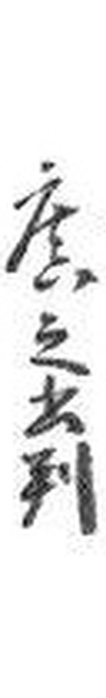広之書判
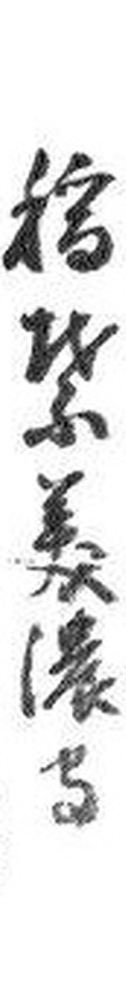稲葉美濃守
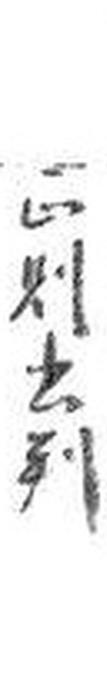正則書判
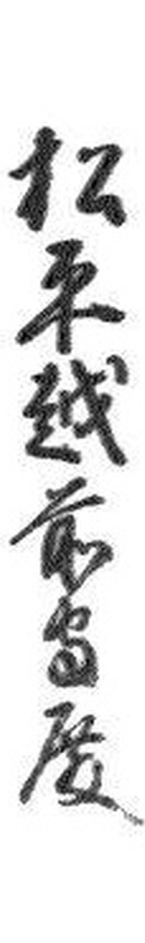松平越前守殿
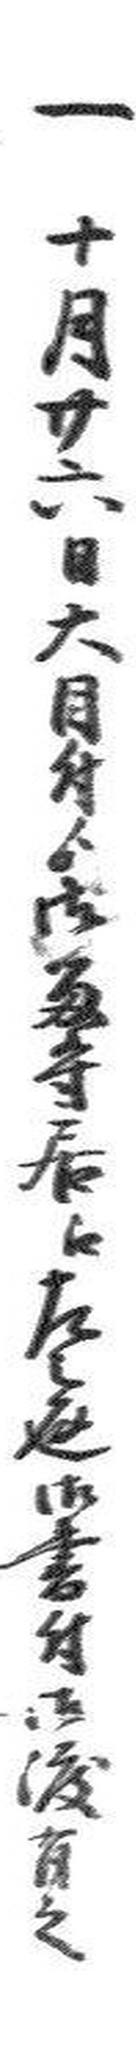一十月廿六日大目付ゟ御留守居江左之通御書付御渡有之
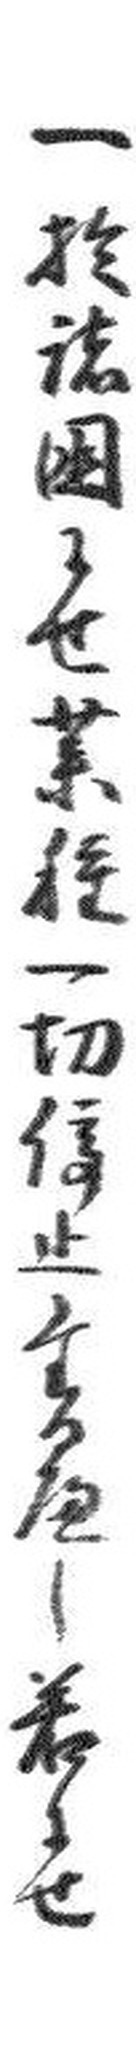一於諸国にせ薬種一切停止たるへし若にせ
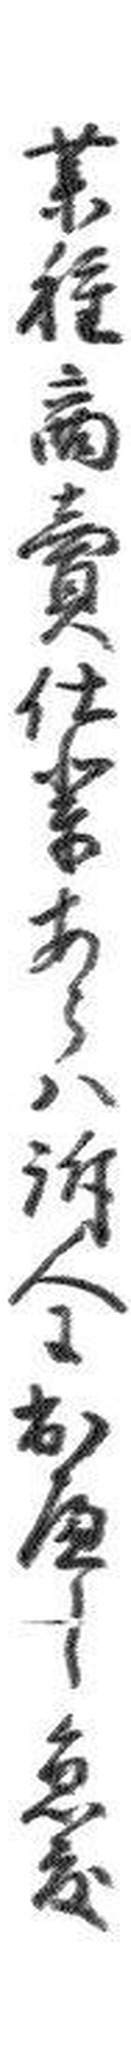薬種商売仕輩あらは訴人に出へし急度
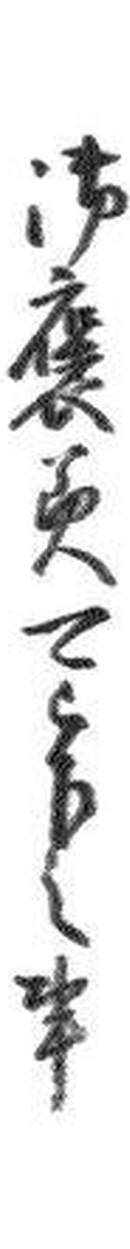御褒美可被下之事
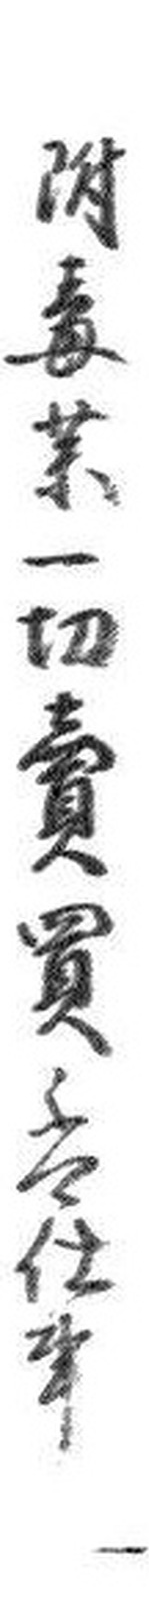附毒薬一切売買不可仕事
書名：家譜 八 光通公 従寛文十年到同十二年
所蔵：福井県文書館 Fukui Prefectural Archives
